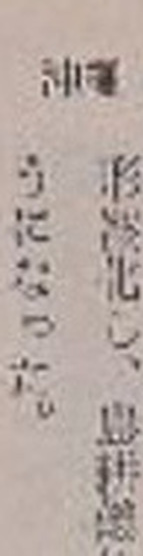うになった。
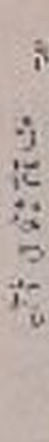うになった。
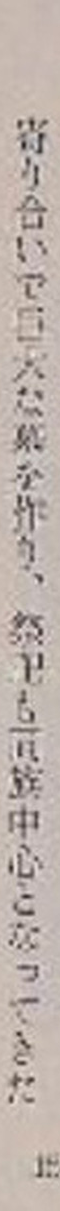寄り合いで巨大な墓を作り、祭祀も同族中心となってきた

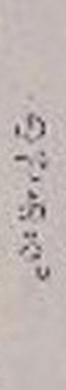のである。
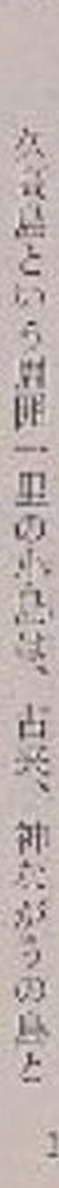久高島という周囲一里の小島は、古来、神ながらの島と
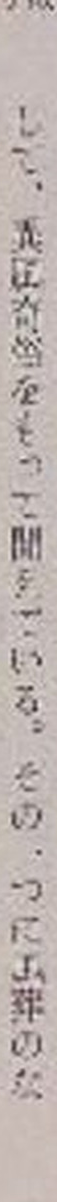して、異風奇俗をもって聞えている。その一つに風葬のな
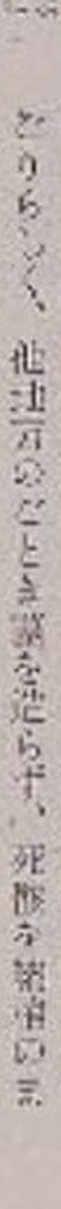ごりらしく、他地方のごとき墓を造らず、死骸をのま
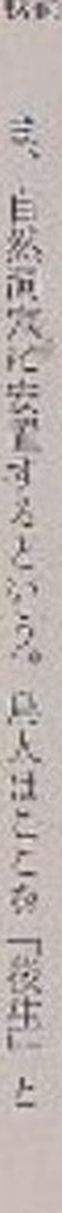ま、自然洞穴に安置するという。島人はここを「後生」と
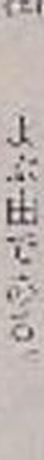よぶ由である。
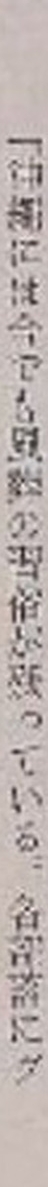「沖縄には今でも風葬の習俗が残っている。各部落にグ
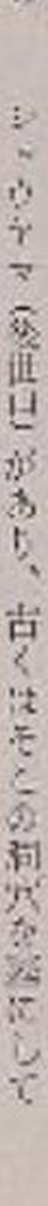ショウヤマ(後生山)があり、古くはそこの洞穴を墓にして
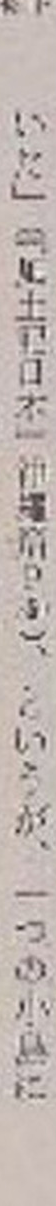いた」(『風土記日本』沖縄篇Ｐ)、というが、一つの小島に
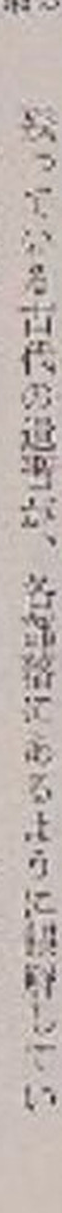残っている古代の遺習が、各部落にあるように誤解してい
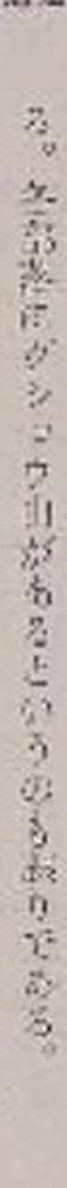る。各部落にグショウ山があるというのも誤りである。
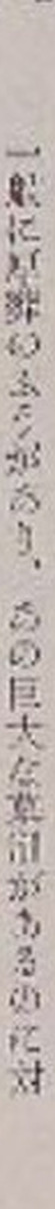一般に厚葬のふうがあり、あの巨大な墓があるのに対
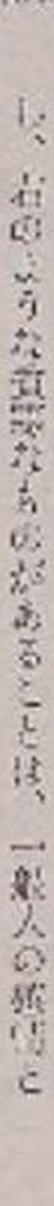し、右のような質なものがあることは、一般人の感と
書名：沖縄固有信仰のおとろえ
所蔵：University of the Ryukyus Library
